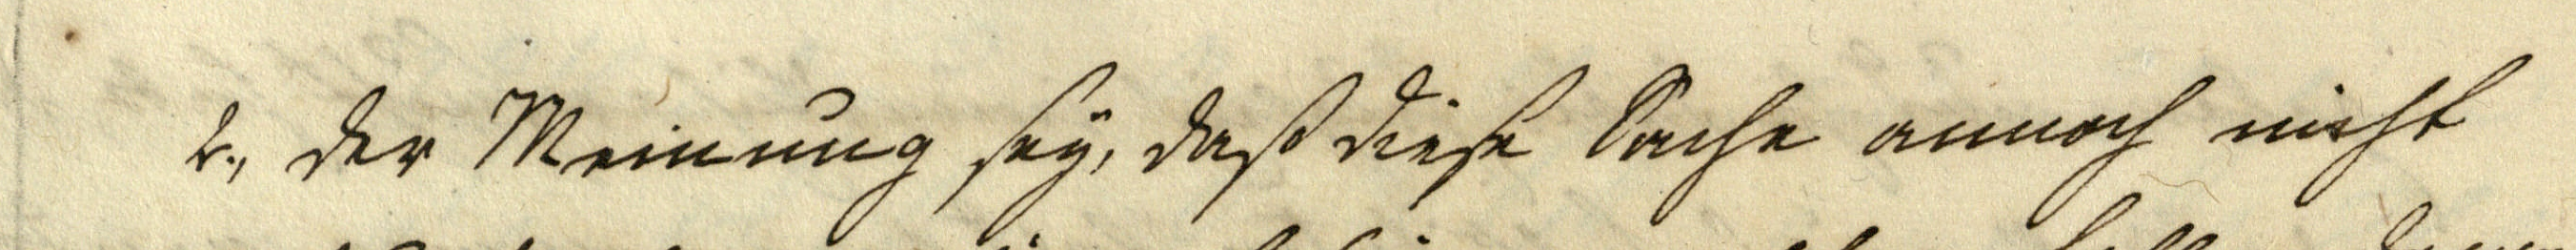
2., der Meinung sey, daß diese Sache annoch nicht
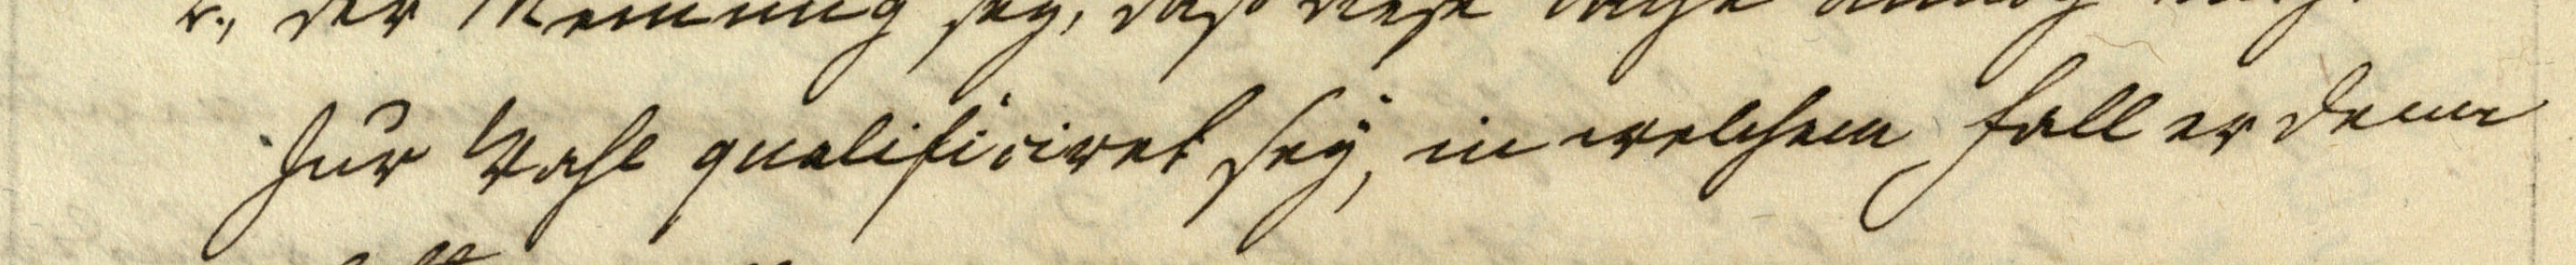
zur Wahl qualificiret sey, in welchem Fall er denn
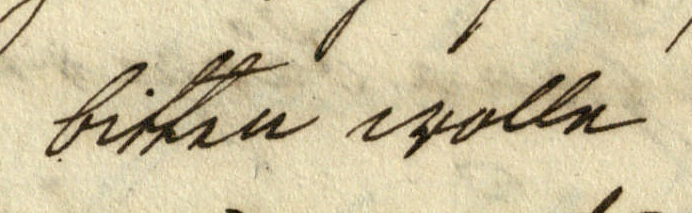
bitten wolle
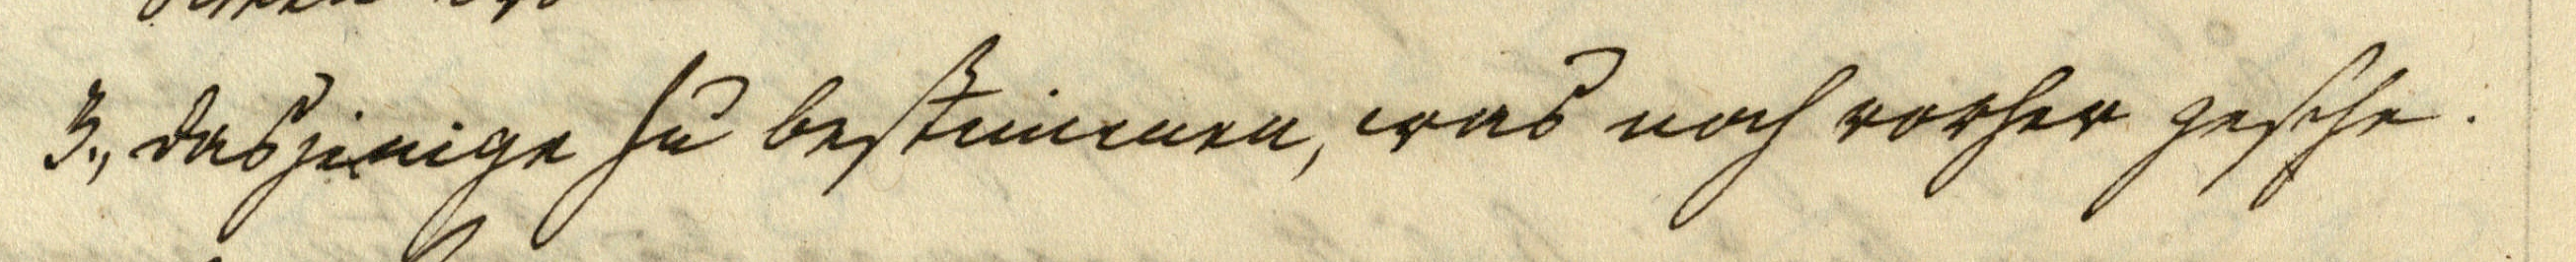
3., dasjenige zu bestimmen, was noch vorher gesche-
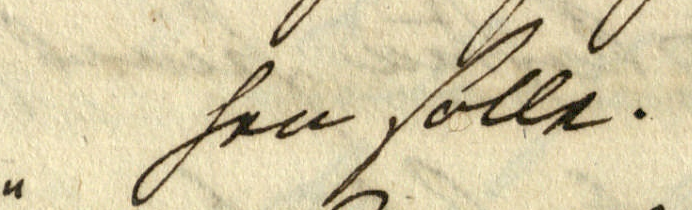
hen solle.
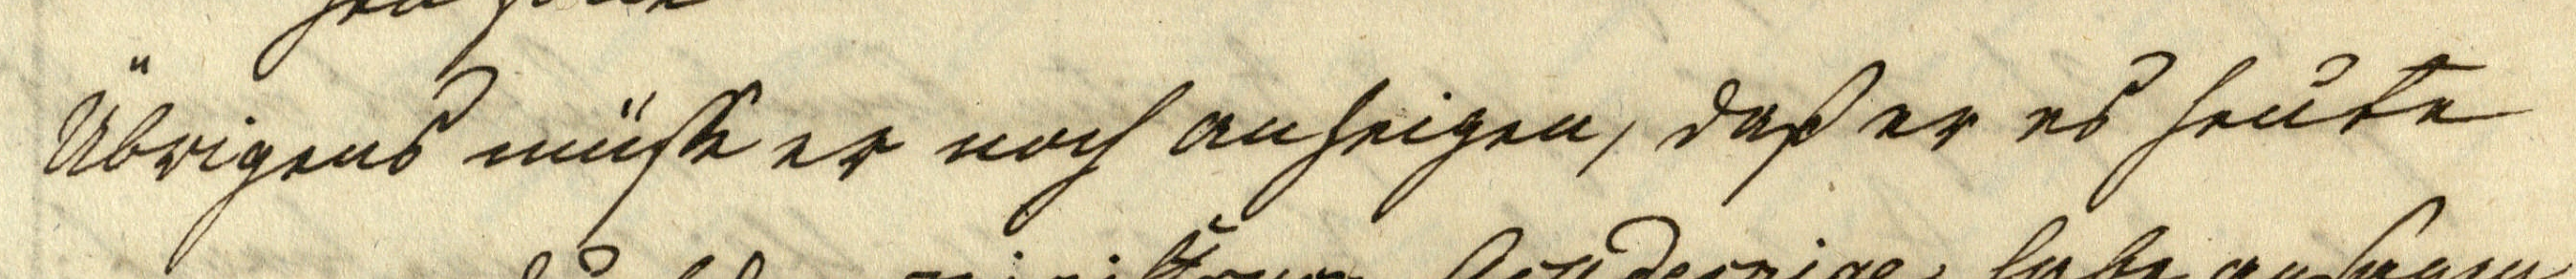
Übrigens müsse er noch anzeigen, daß er es heute
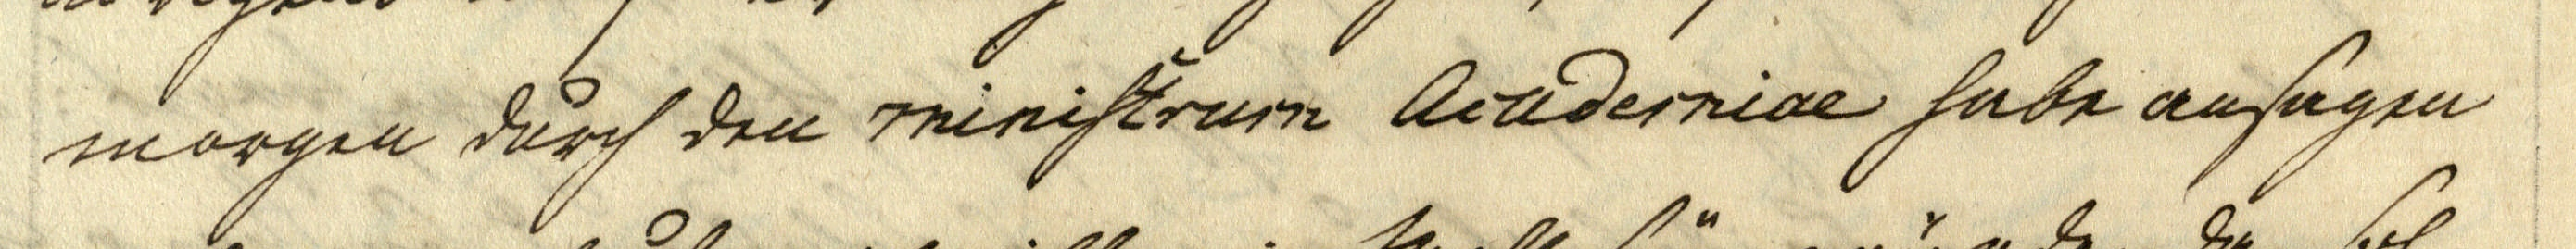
morgen durch den Ministrum Academiae habe ansagen
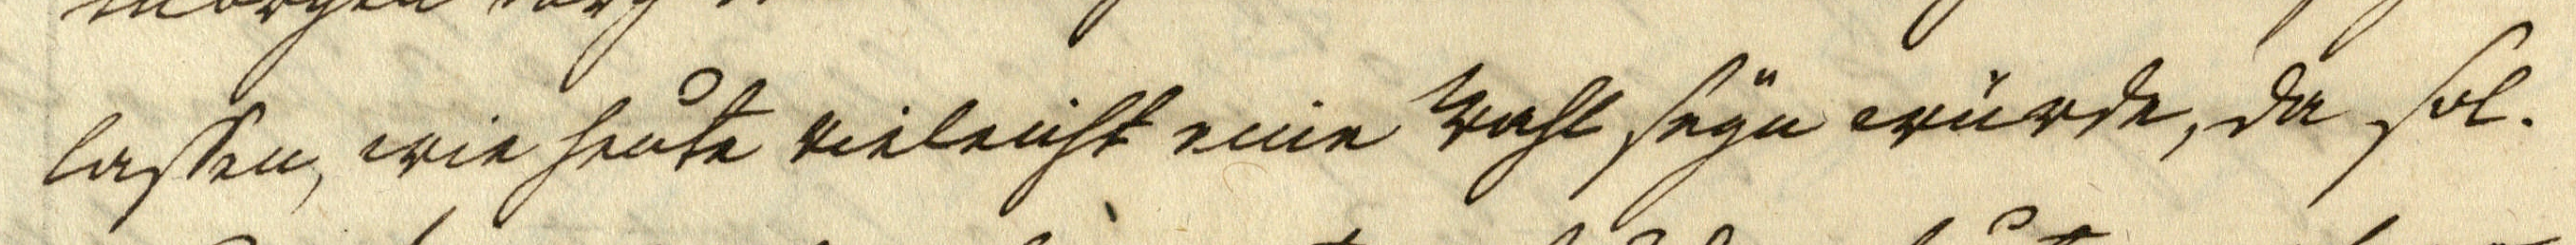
lassen, wie heute vieleicht eine Wahl seyn würde, da sol-
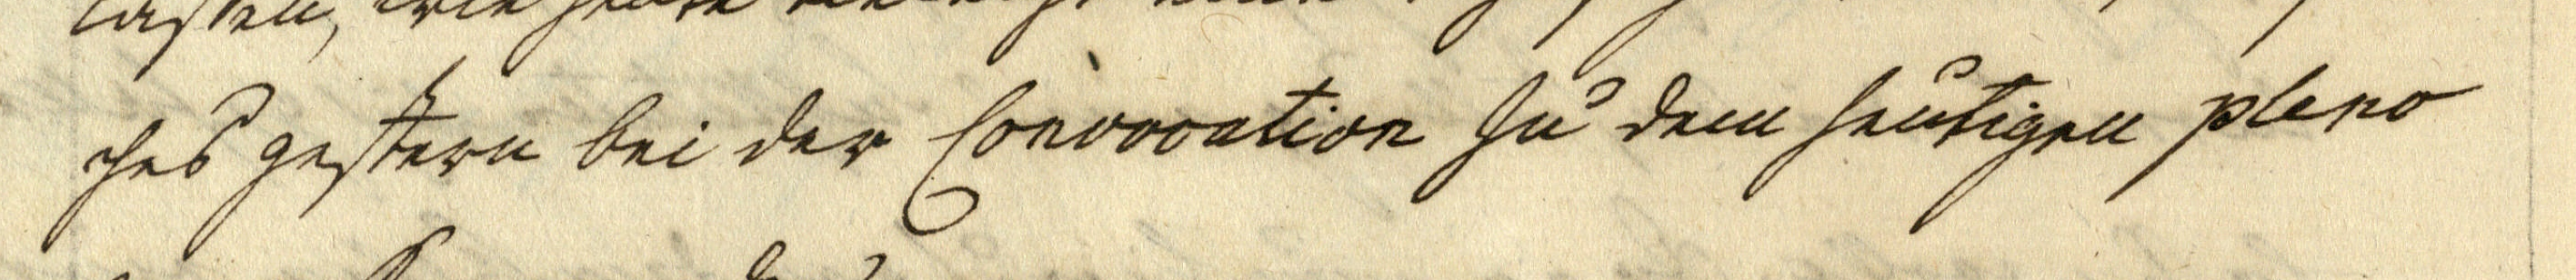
ches gestern bei der convocation zu dem heutigen pleno
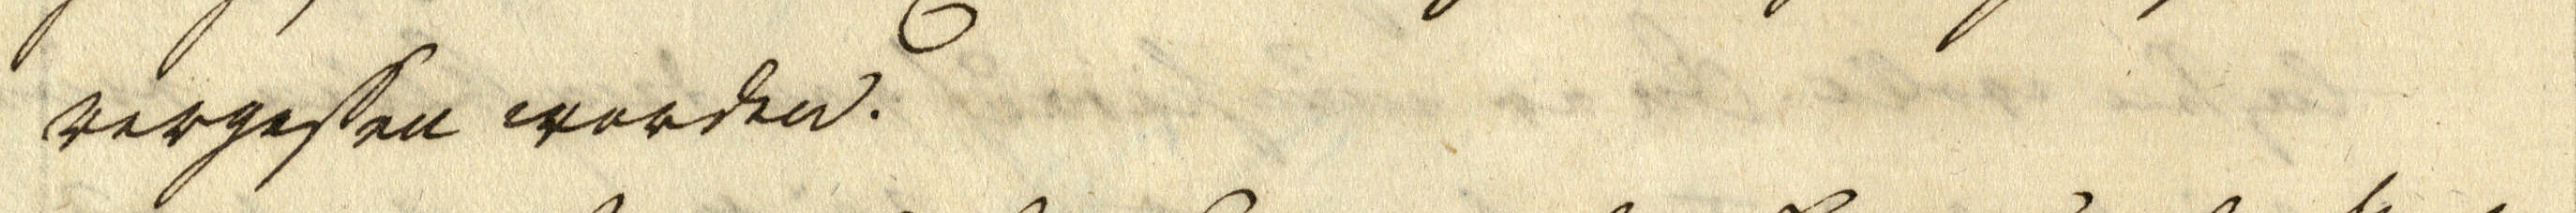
vergessen worden.
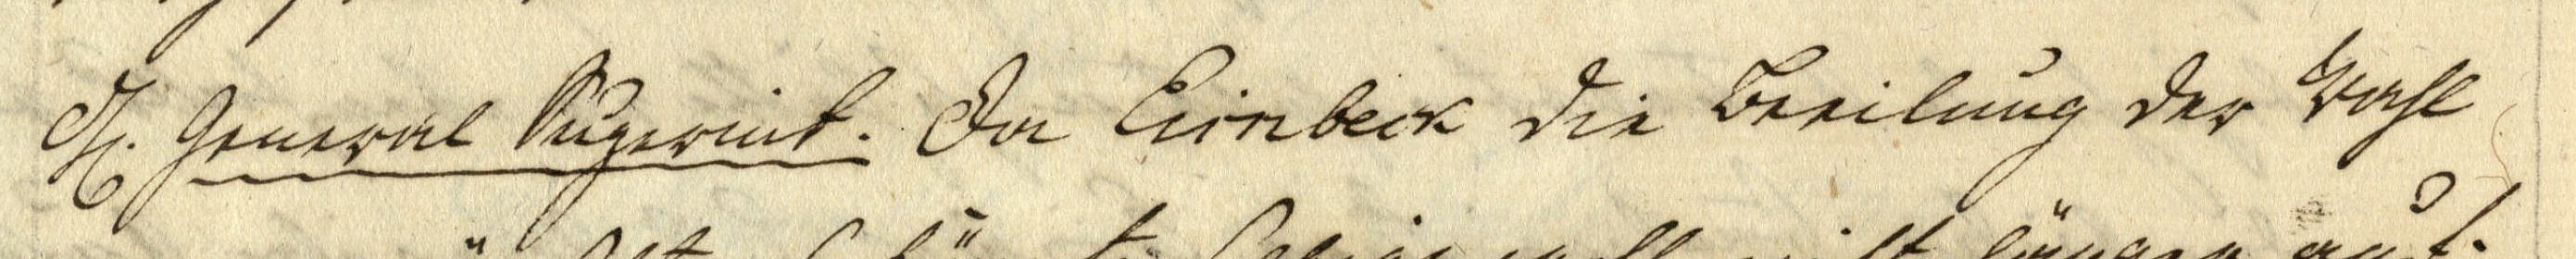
dh. General Superint. Da Eimbeck die Beeilung der Wahl
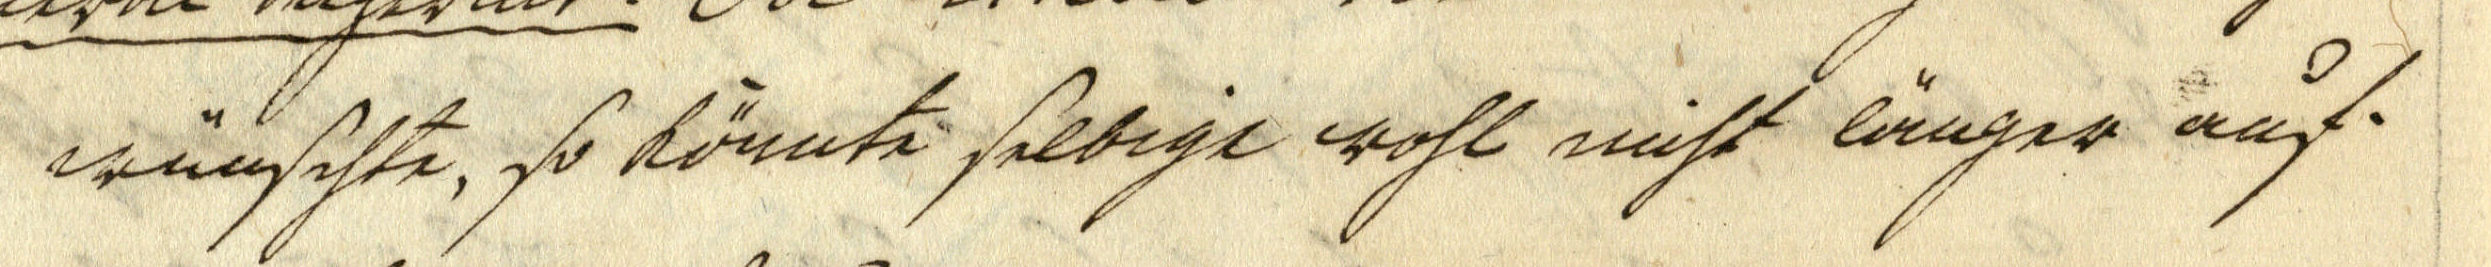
wünschte, so könnte selbige wohl nicht länger auf-
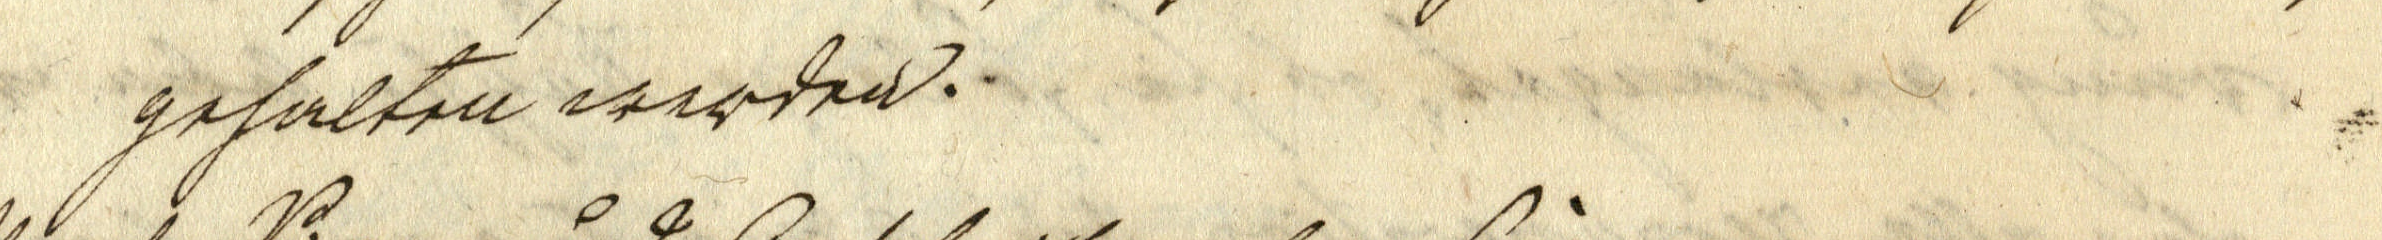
gehalten werden.
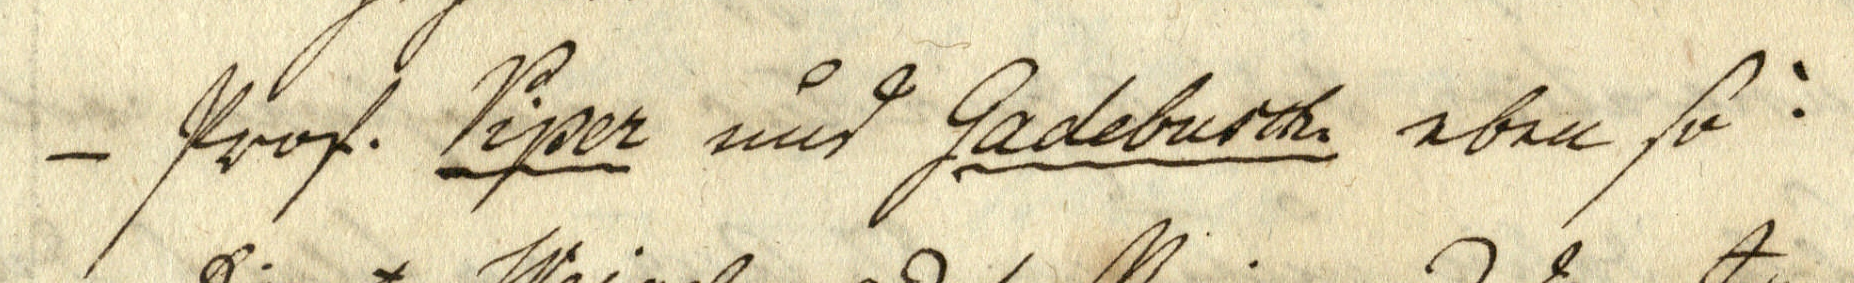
- Prof. Piper und Gadebusch eben so.
